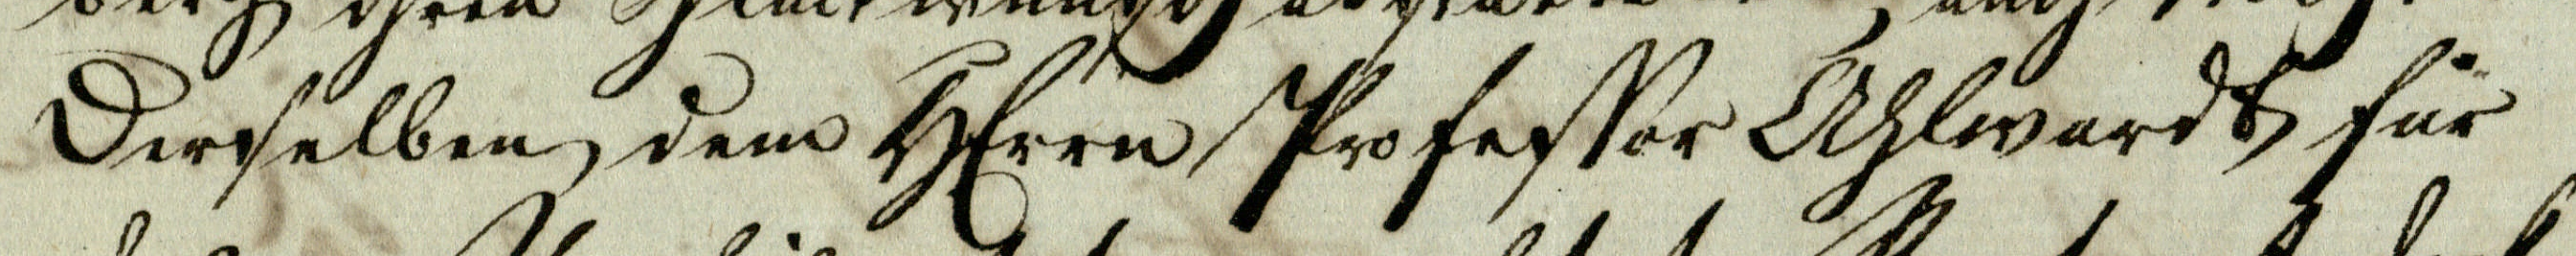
derselben, dem Herrn Professor Ahlwardt für
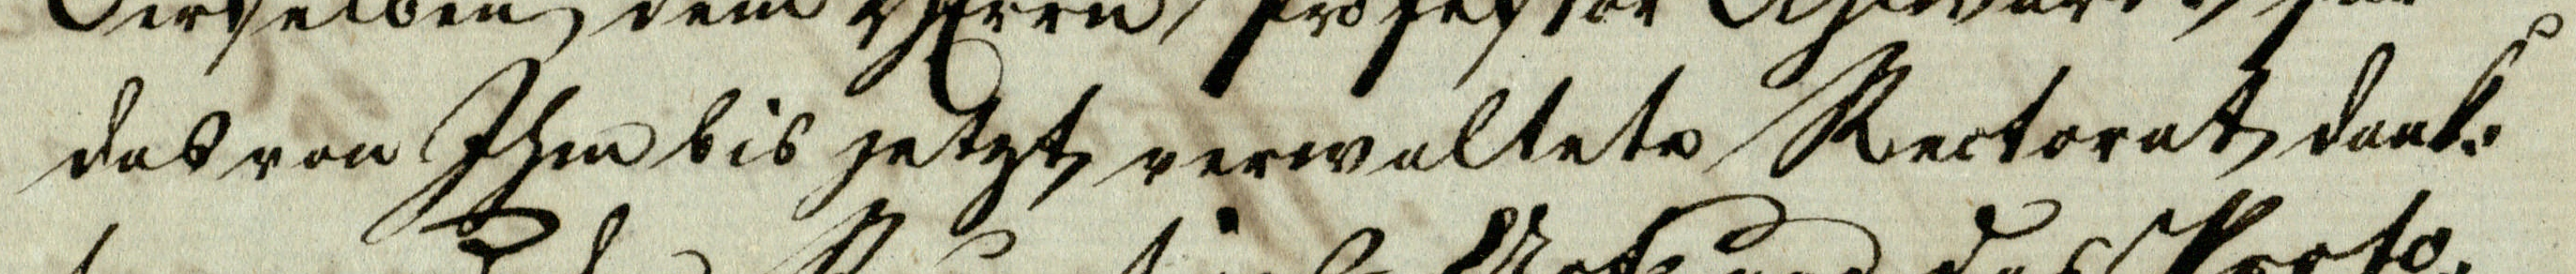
das von Ih bis jetzt verwaltete Rectorats dank¬
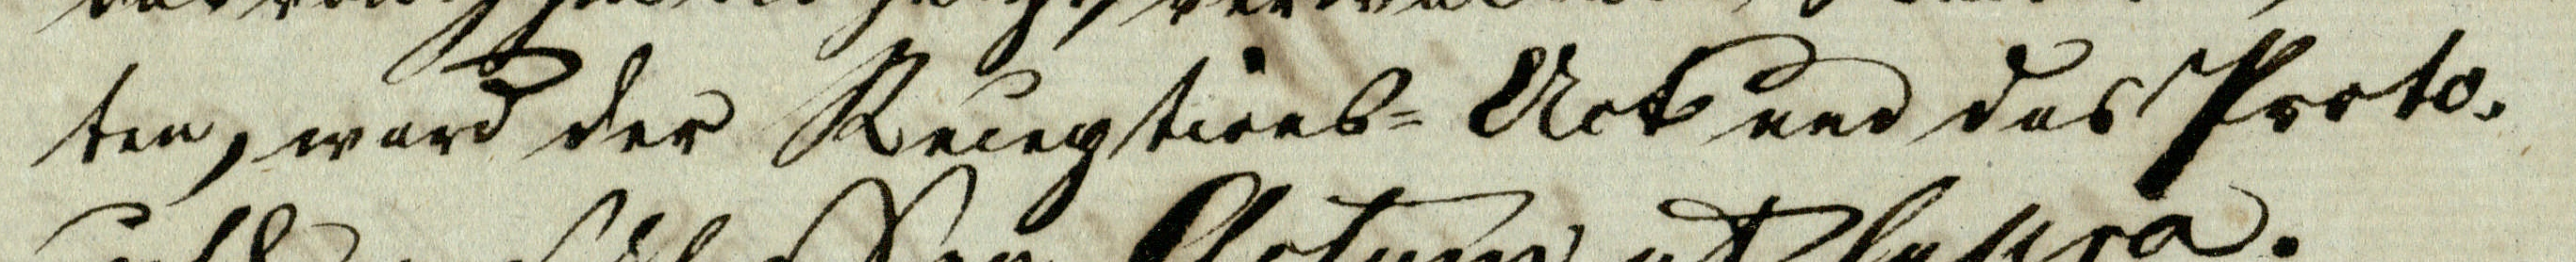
tun, ward der Reugtions-Act und der Proto¬
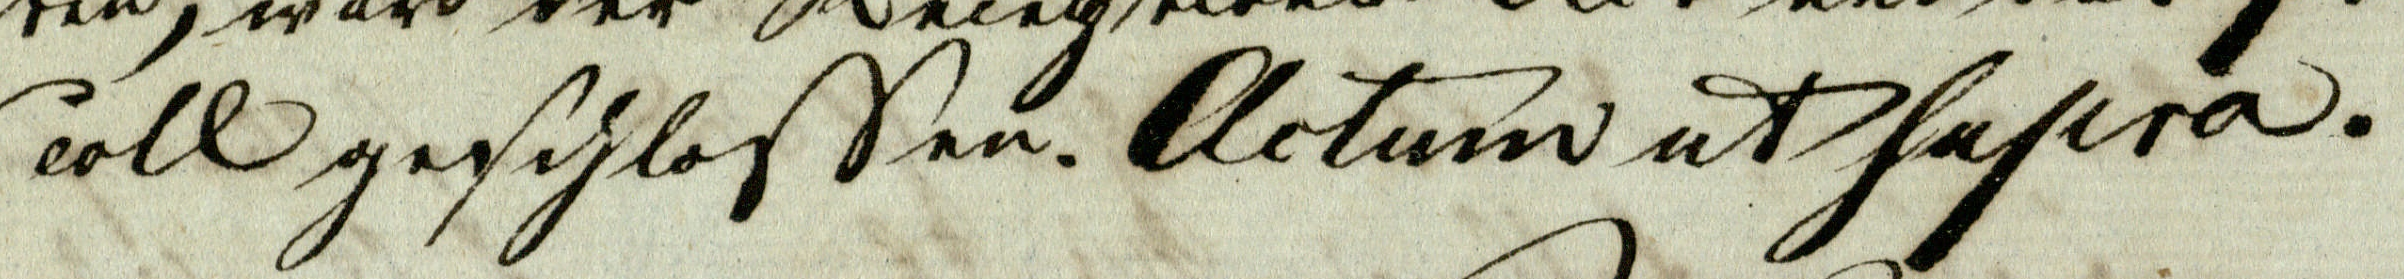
coll geschlossen. Actum et Supra.
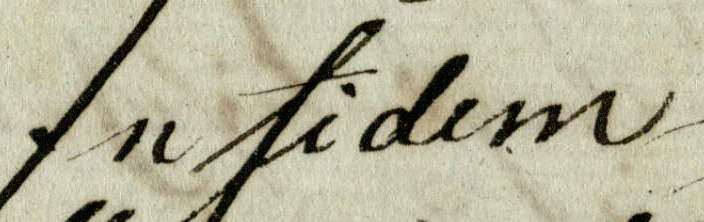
In fidem
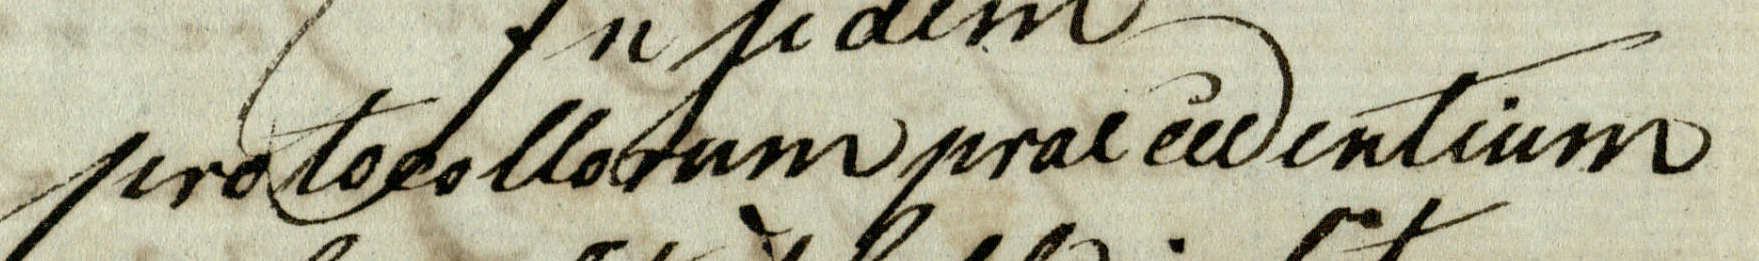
protocollorum praleccentium
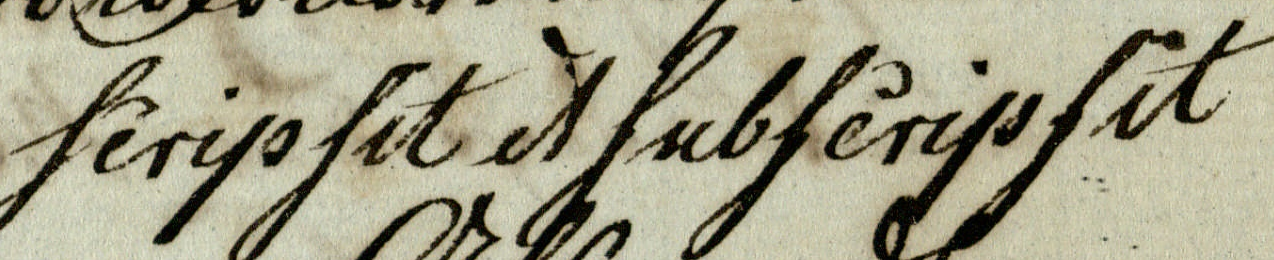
feripfit et fubferipfit
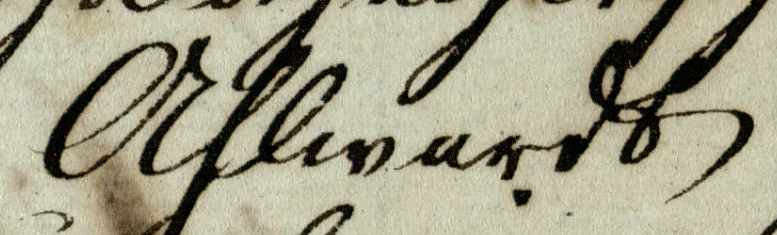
Ahlwardt
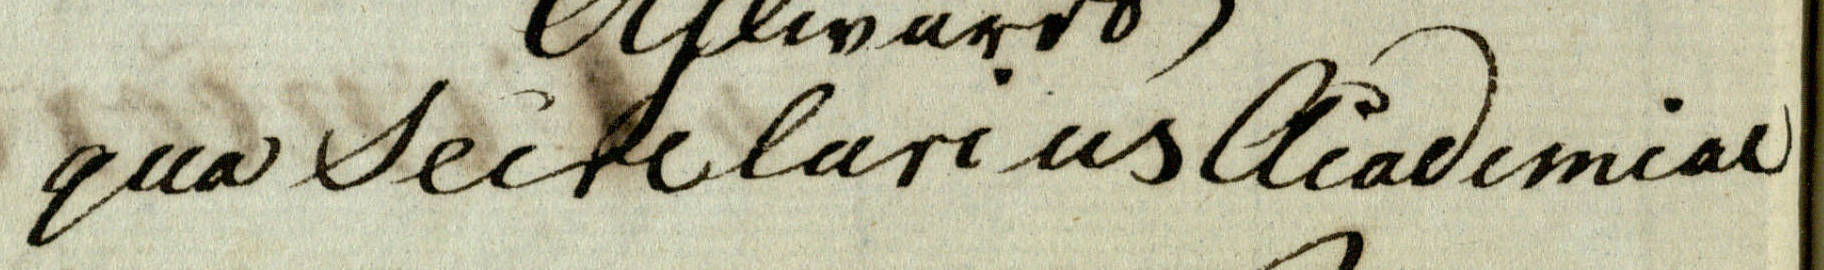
qua Secrelarius Academiae
